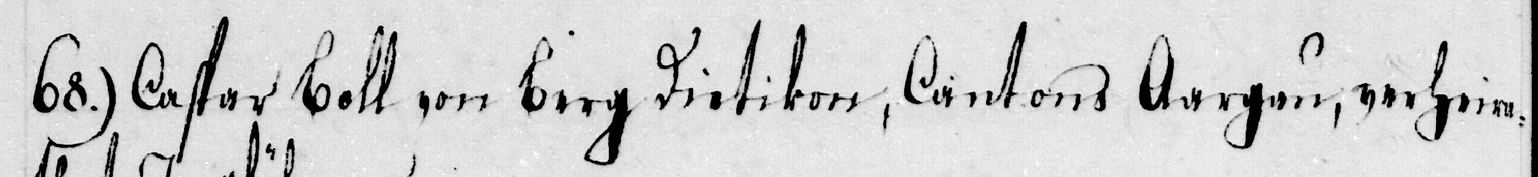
68.) Caspar Boll von Berg Dietikon, Cantons Aargau, verheira¬
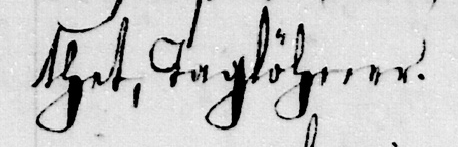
thet, Taglöhner.
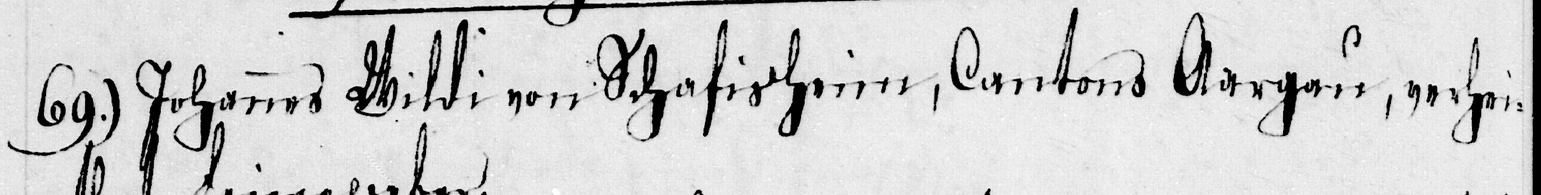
69.) Johannes Wildi von Schafisheim, Cantons Aargau, verhei¬
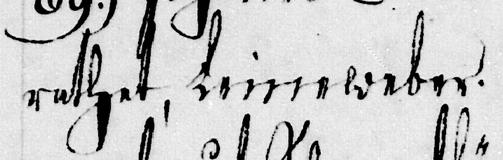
rathet, Leineweber.
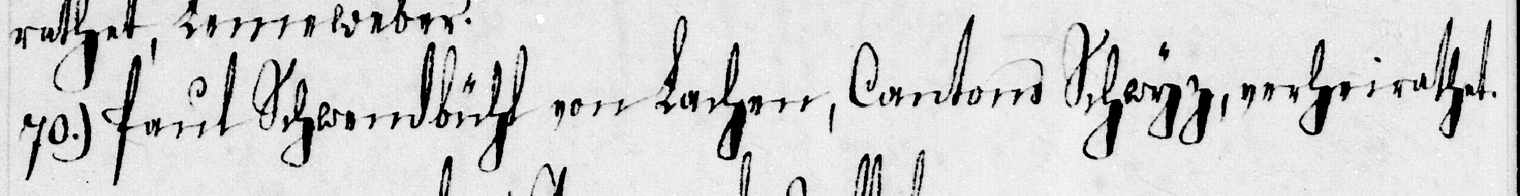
70.) Paul Schwendbühl von Lachen, Cantons Schwyz, verheirathet.
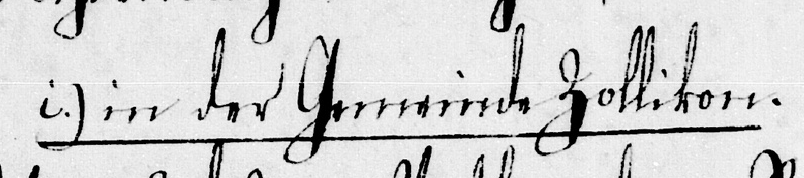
i.) in der Gemeinde Zollikon.
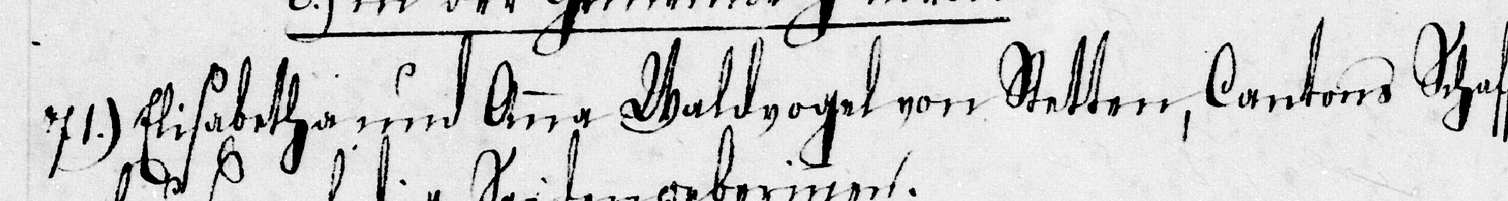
71.) Elisabetha und Anna Waldvogel von Stetten, Cantons Scha¬
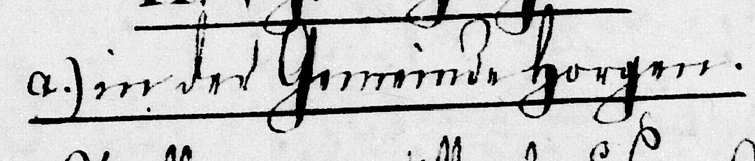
a.) in der Gemeinde Horgen.
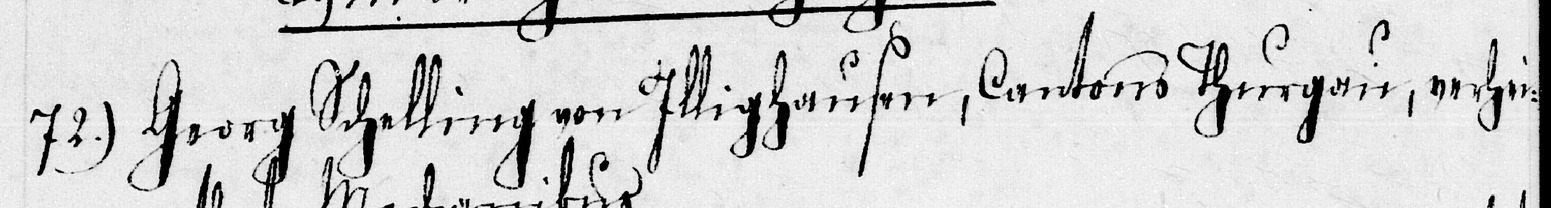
72.) Georg Schelling von Illighausen, Cantons Thurgau, verhe¬
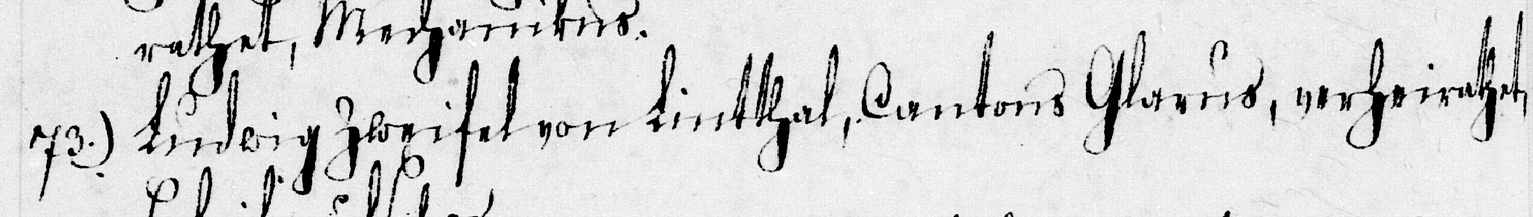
73.) Ludwig Zweifel von Lintthal, Cantons Glarus, verheirathe¬
